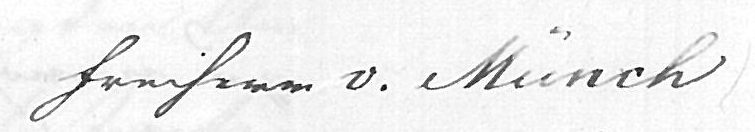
Freiherr v. Münch
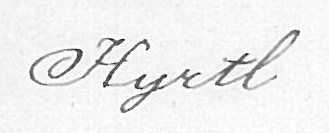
Hyrtl
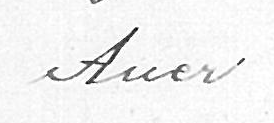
Auer
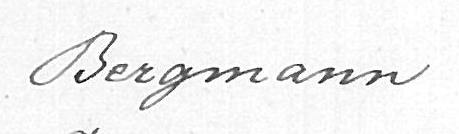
Bergmann
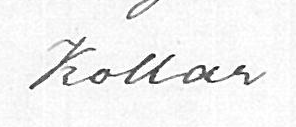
Kollar
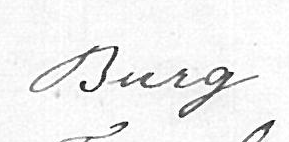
Burg
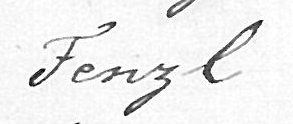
Fenzl
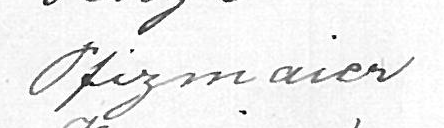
Pfizmaier
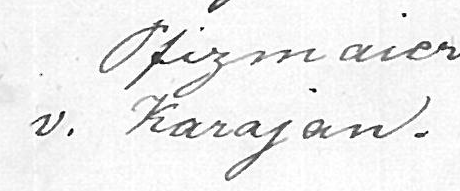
v. Karajan
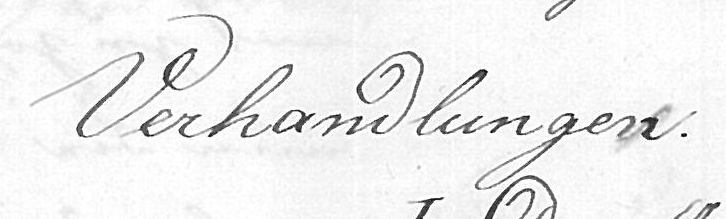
Verhandlungen.
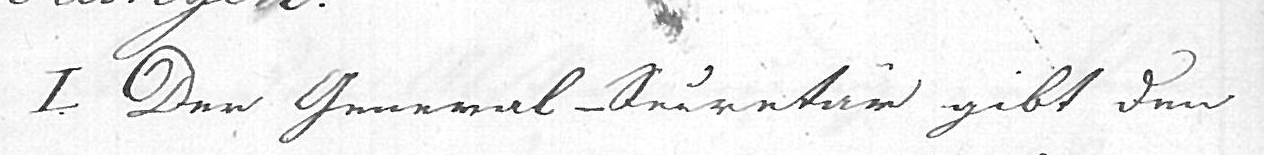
I. Der General-Secretär gibt den
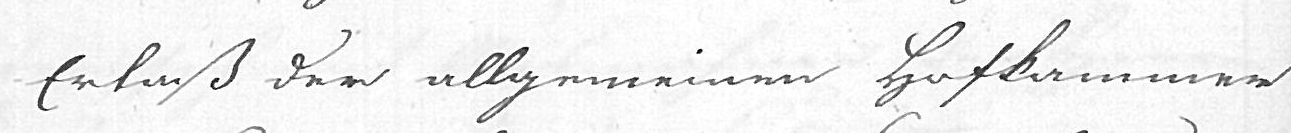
Erlaß der allgemeinen Hofkammer
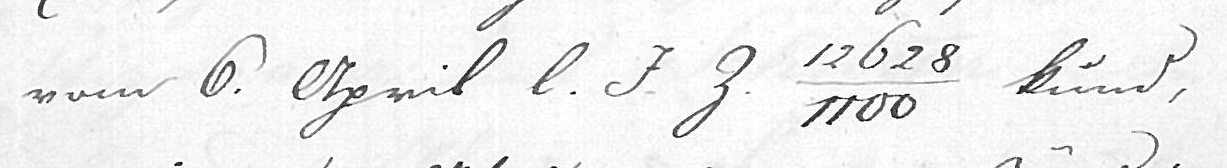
von 6. April l.J. Z. 12628/1100 kund,
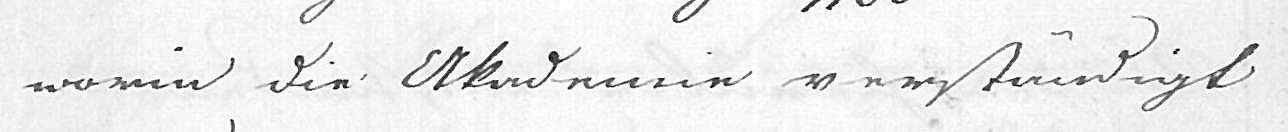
worin die Akademie verständigt
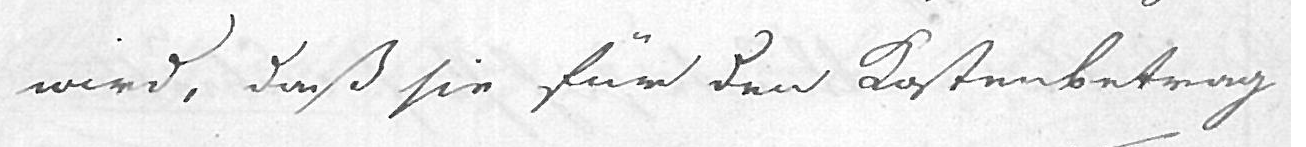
wird, daß sie für den Kostenbetrag
